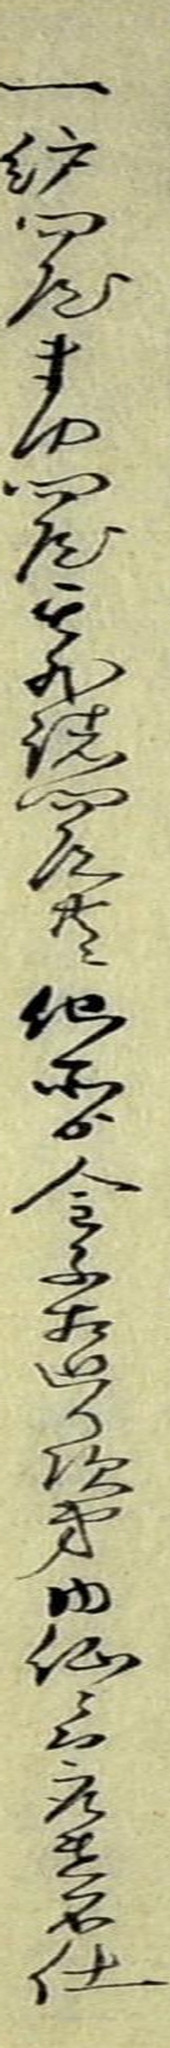一䋆問屋まゆ問屋其外諸問屋共に他所ゟ金子相廻り次第内証に而取遣不仕
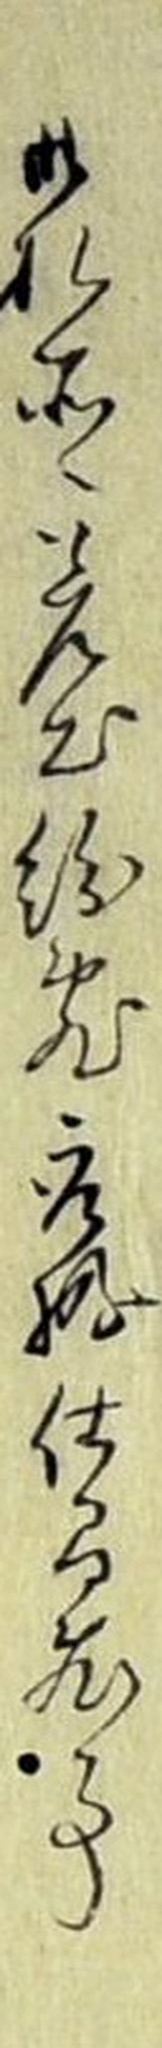御札所へ差出紛敷取扱仕間敷事
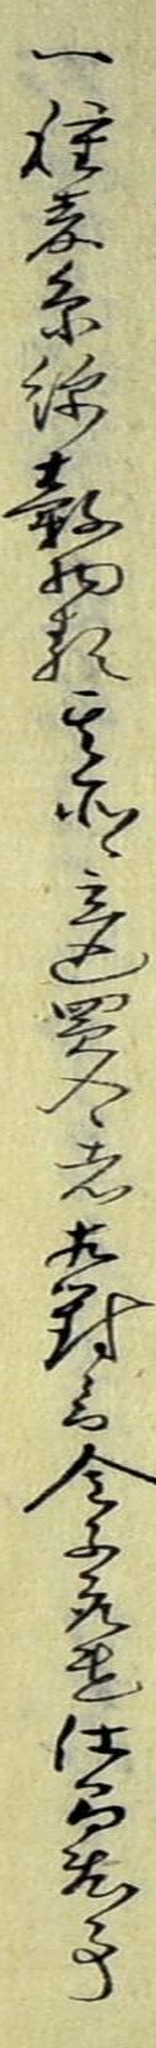一種麦糸綿穀物類其所へ立込買入候者相対に而金子取遣仕間敷事

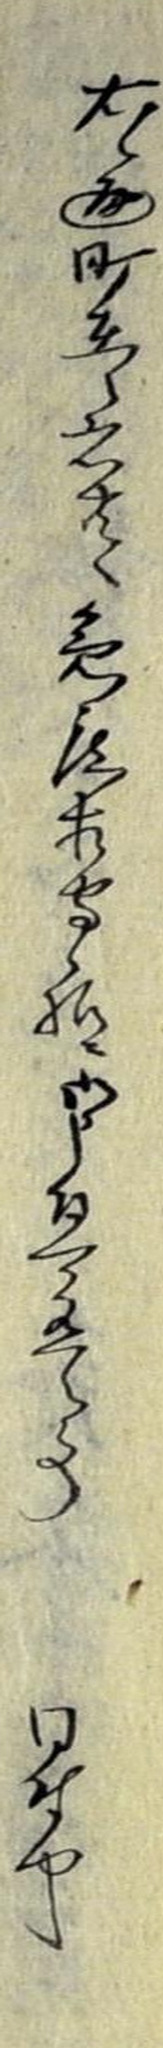右之通町在之者共へ急度相守候様に御申付可有之事目付中
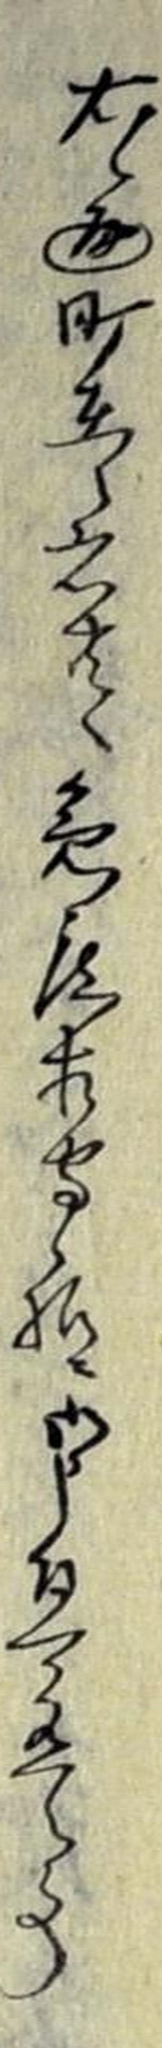右之通町在之者共へ急度相守候様に御申付可有之事目付中
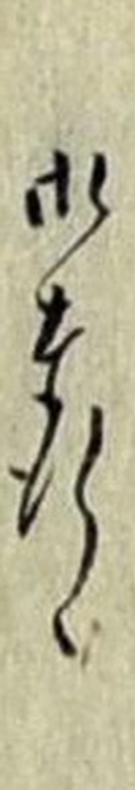御奉行へ
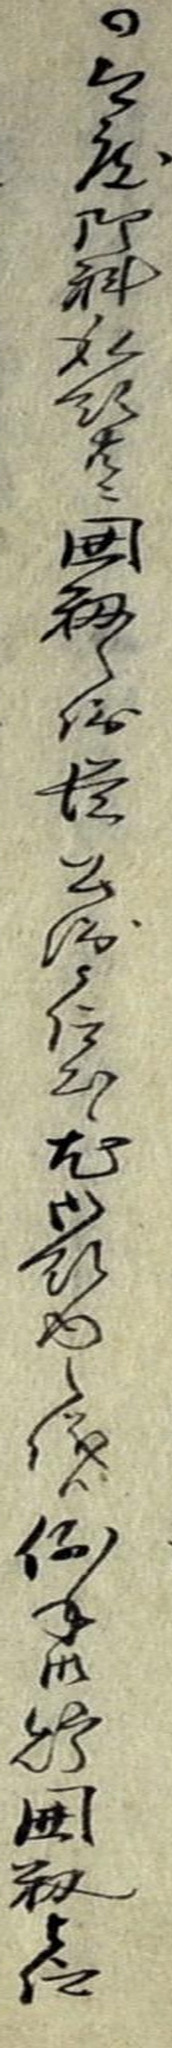〇今度御料私領共に囲籾之儀従公儀被仰出候尤御領内之儀は例年御貯囲籾被仰
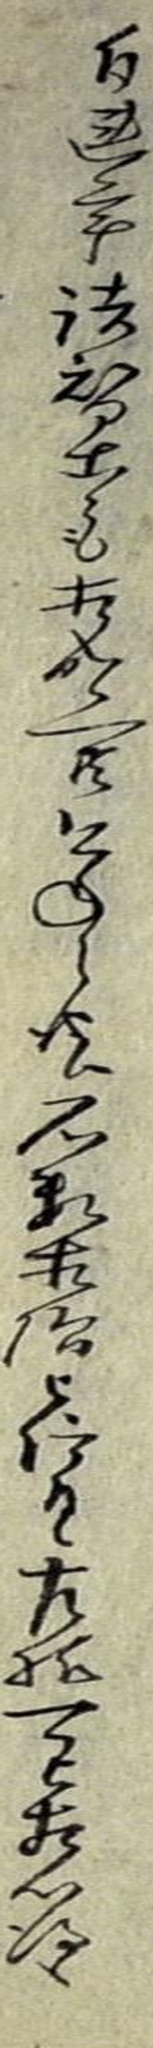付連年詰替等にも相成候へ共今年之儀は石数相増被仰付候左様可被相心得候
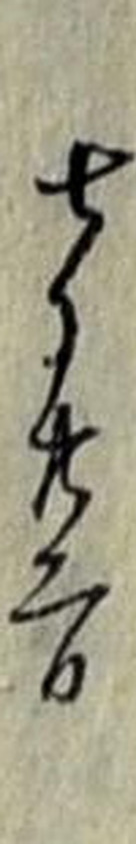七月廿二日
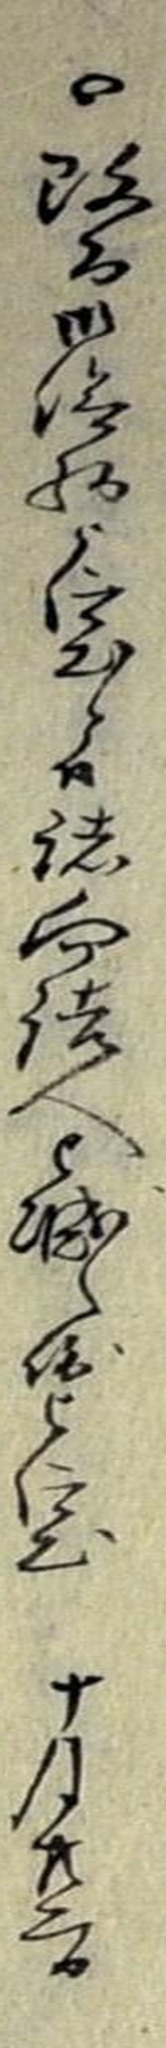〇改而御倹約被仰出候に付諸向詰人被減候儀被仰出十月廿二日
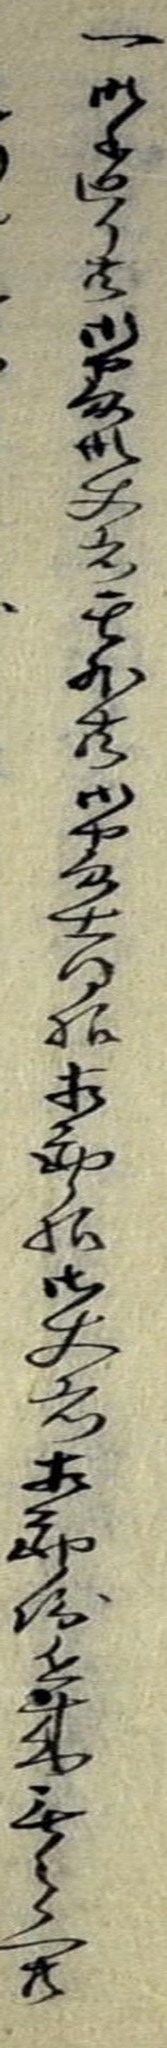一御手廻り共御番御使者其外共御番士同様相勤候様御使者相勤儀近来無之候へ共
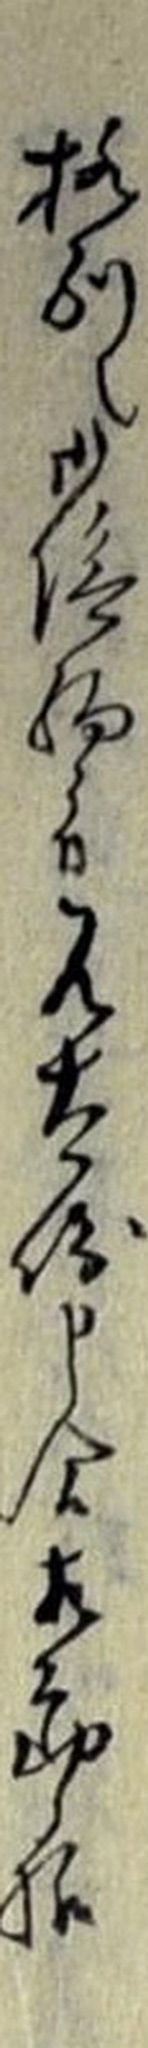格別之御倹約に付乍太儀申合相勤候様
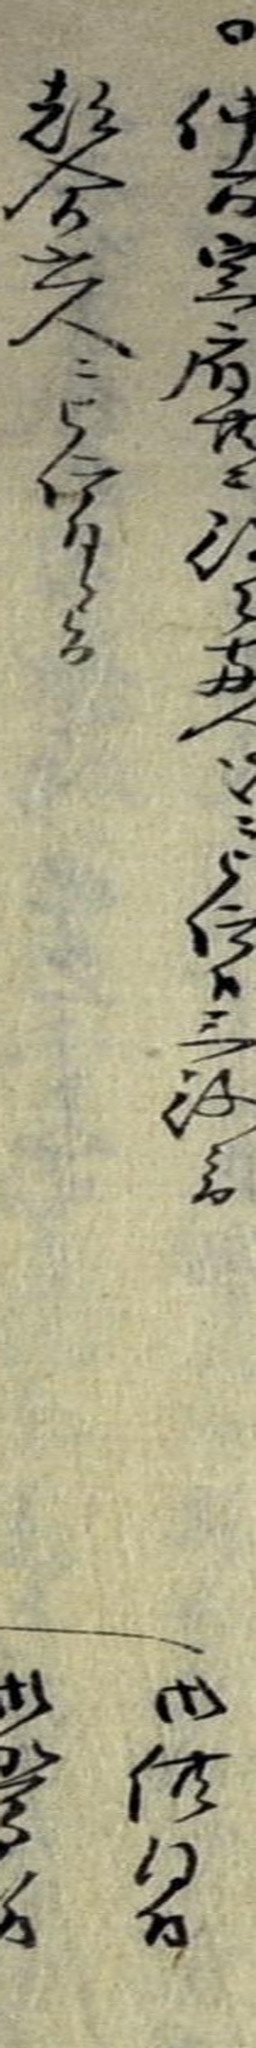都合六人に被仰付候旨御駕附
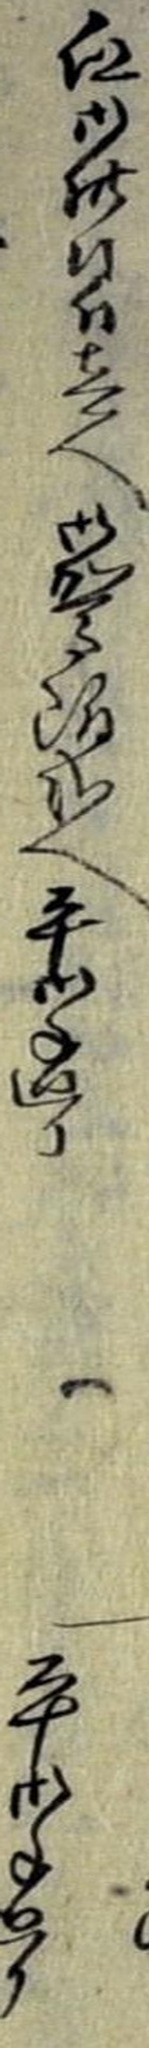但御供目付壱人御駕附弐人平御手廻り平御手廻り
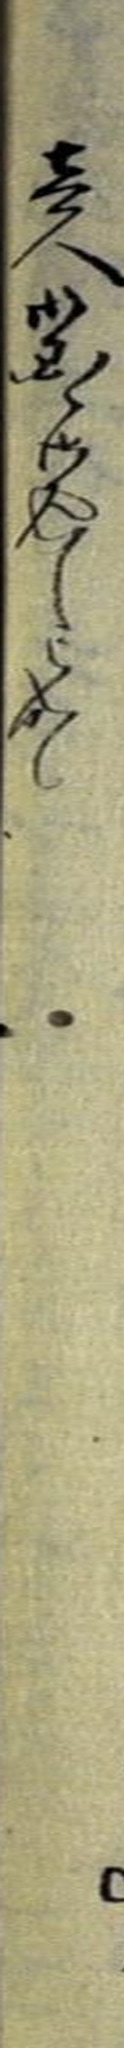壱人御国へ御返し被成候
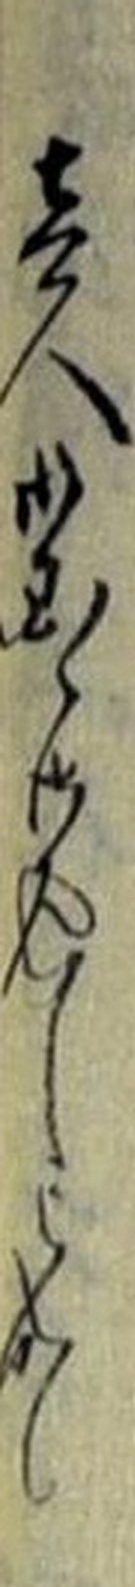壱人御国へ御返し被成候
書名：命令之部 二
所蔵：福井県文書館 Fukui Prefectural Archives
